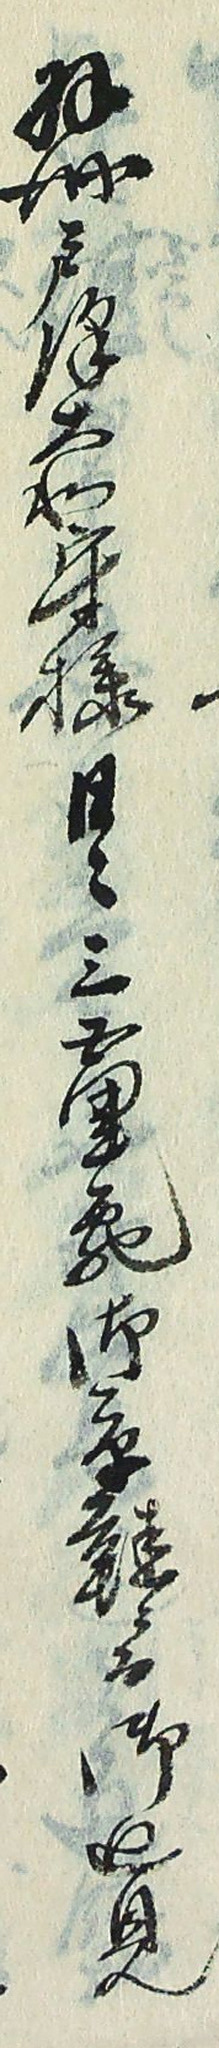羽州戸澤大和守様日々三五里宛草鞋ニ而御廻見
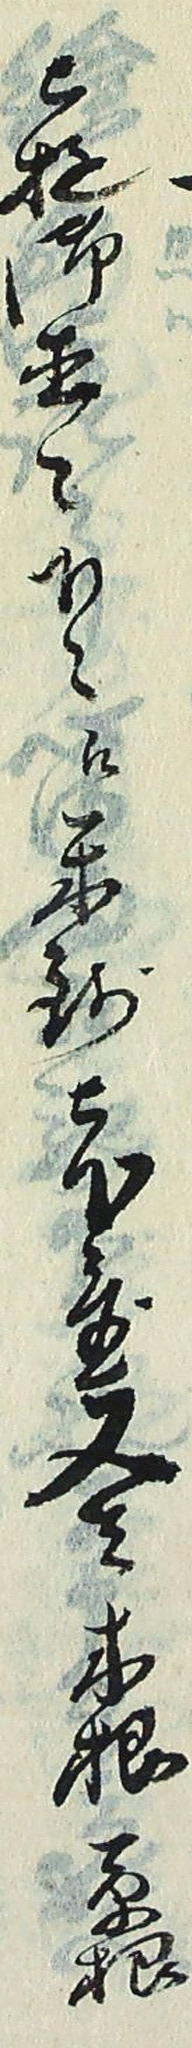被遊御直々下々江米銭被下置又者木根草根
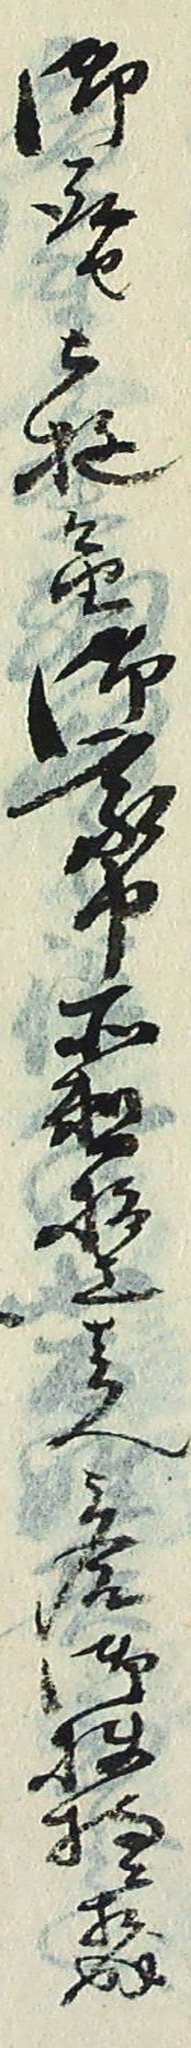御取セ被遊候由御家中所務指上壱人三合御扶持ニ相成
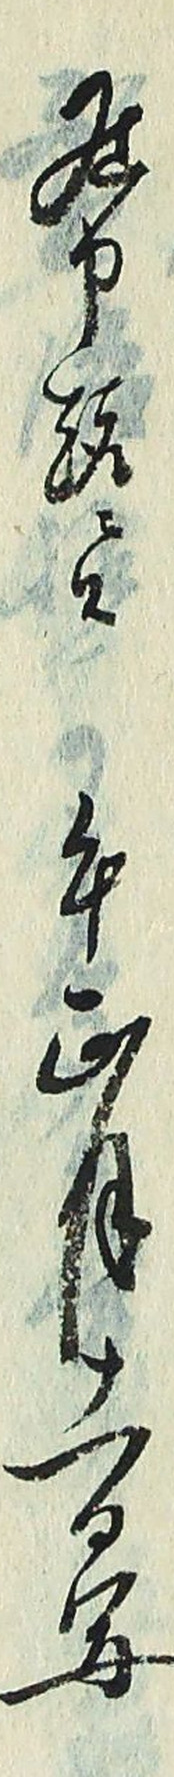居申趣ニ候午正月十一日写
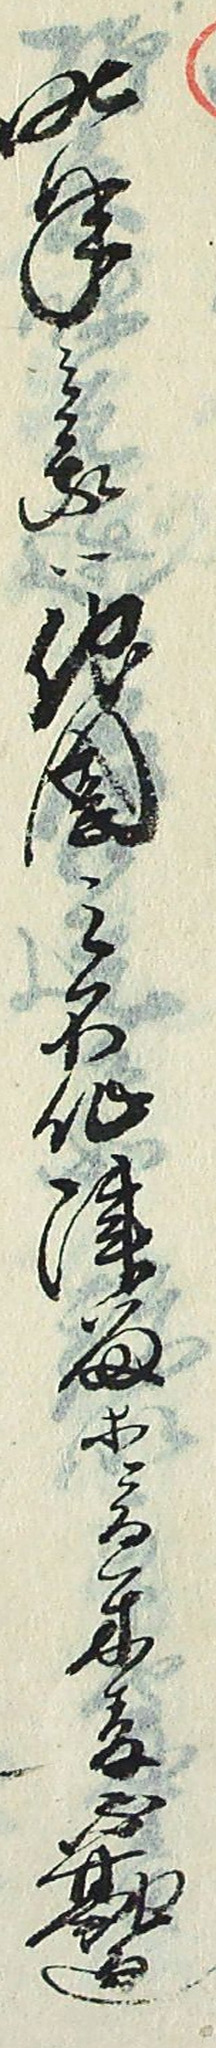昨年之義ハ他国之不作津留等ニ而米麦不融通
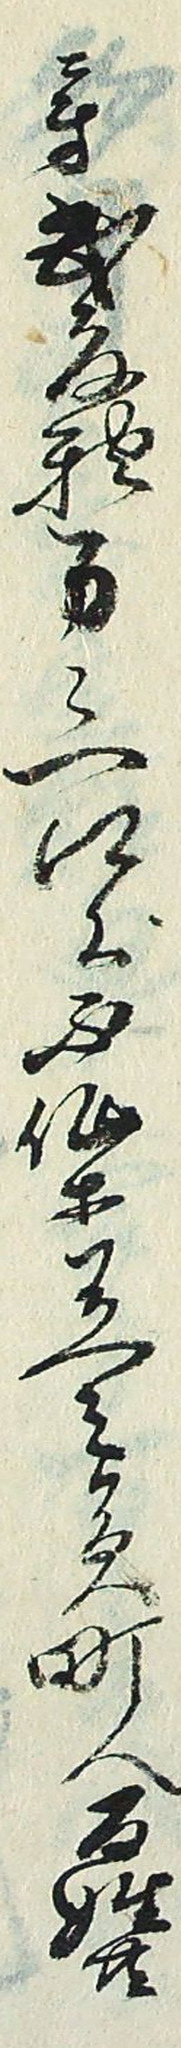ニ付當夏秋万々一郷分不作等有之候而ハ町人百姓共
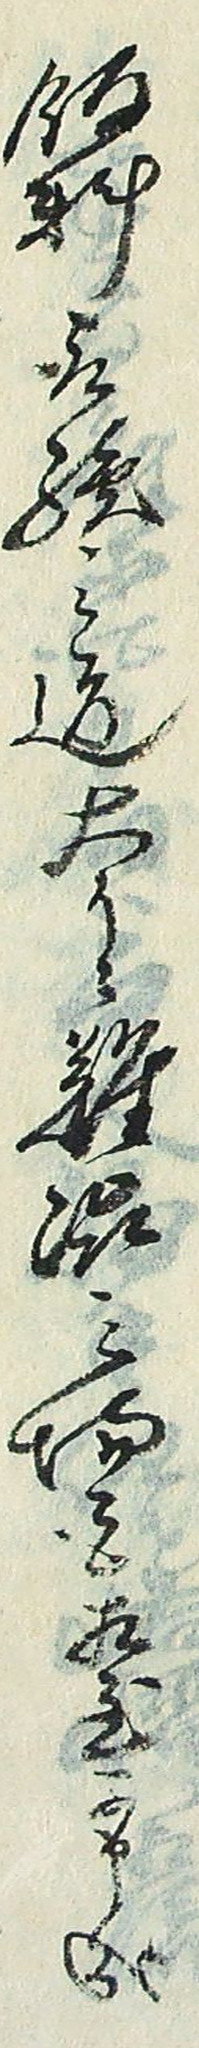飯料取續之道大に難渋之場ニも相至可申哉
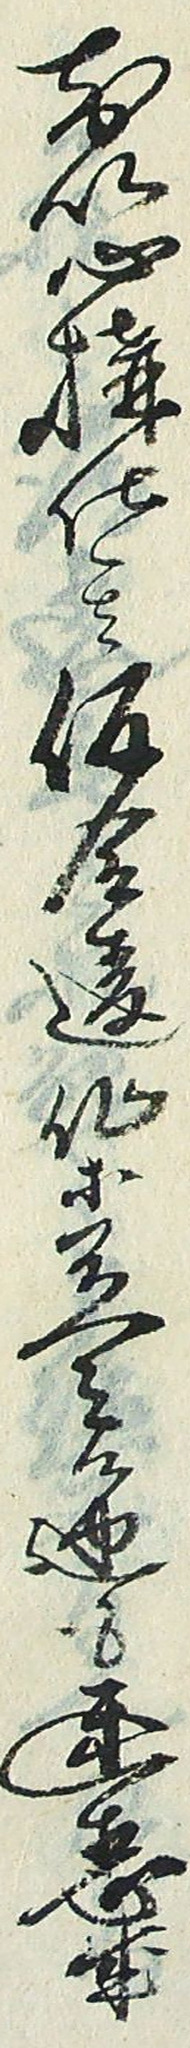前以心構仕候者仮令違作有之候迚も迷惑成

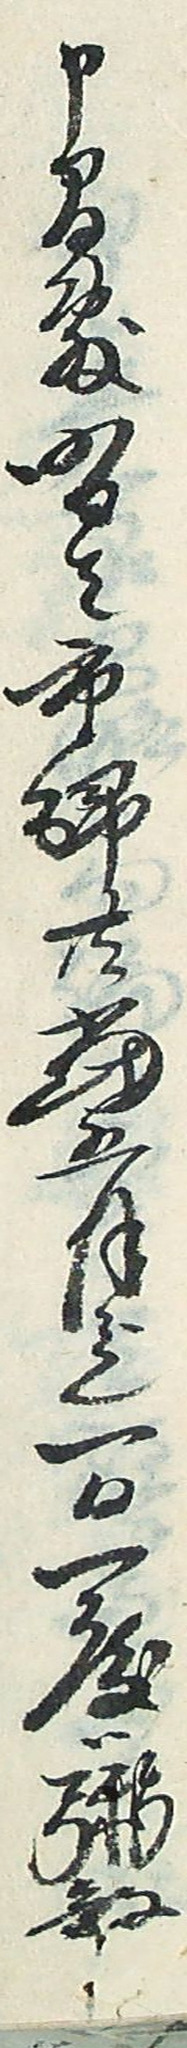申間敷仍而者市郷共當五月迄一日一度ハ粥雑
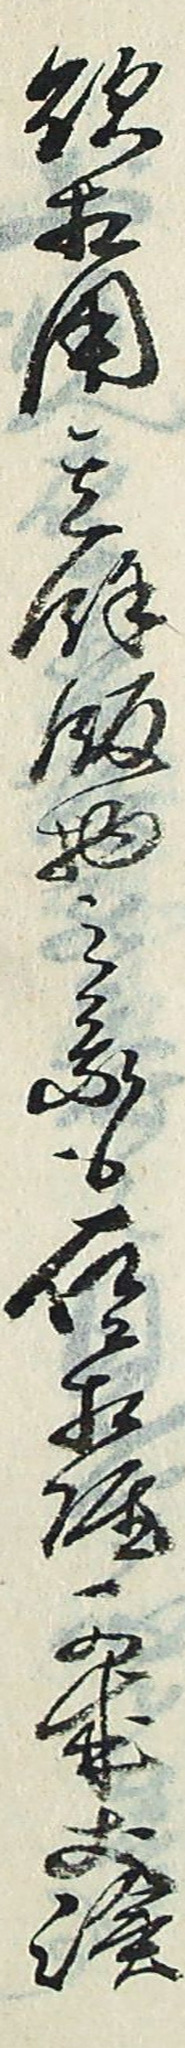炊相用其餘飯物之義も右ニ相准可成丈倹
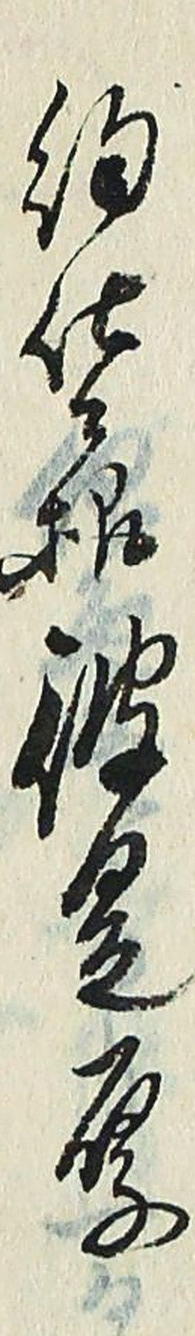約仕候様彼是厚
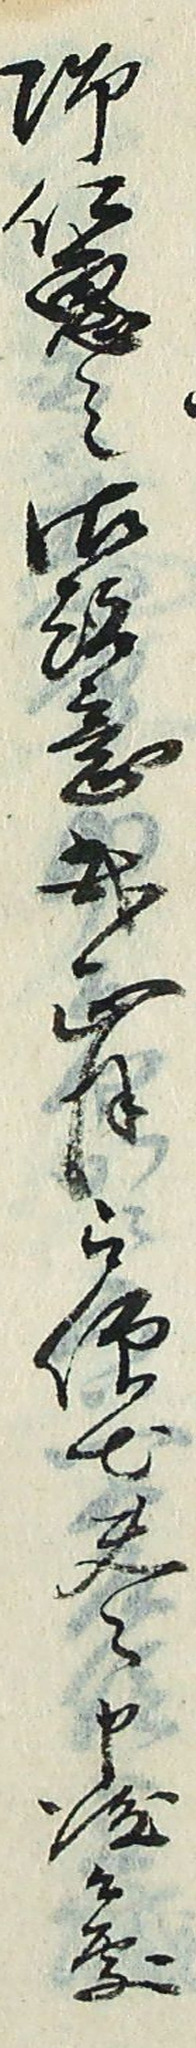御仁恵之御趣意當正月被仰出夫々申渡候處
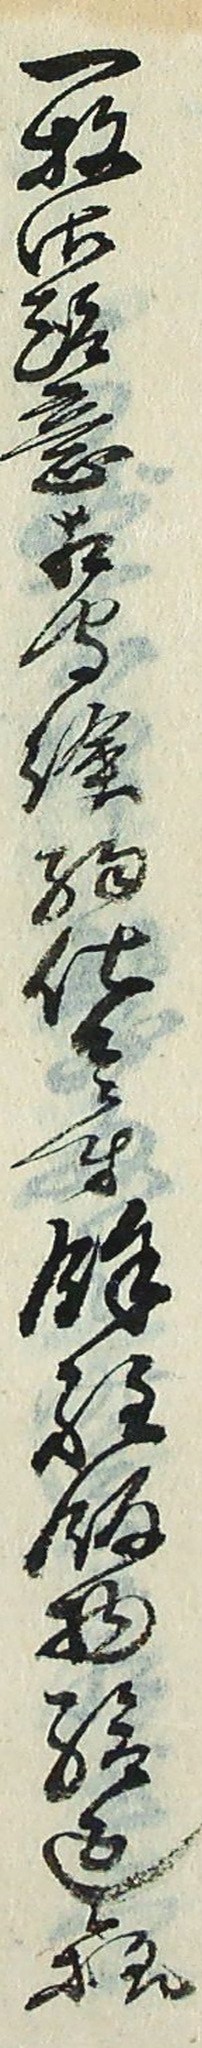一牧御趣意相守倹約仕候ニ付餘程飯物給延候様
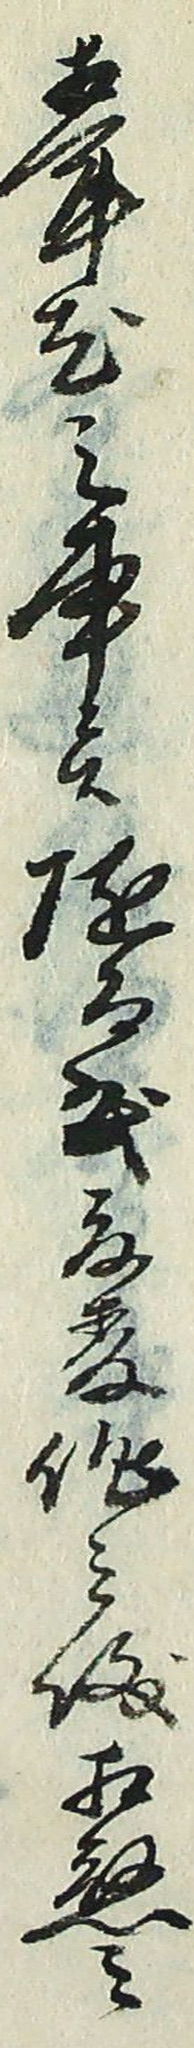相聞尤之事ニ候随而當夏麦作之儀相應之
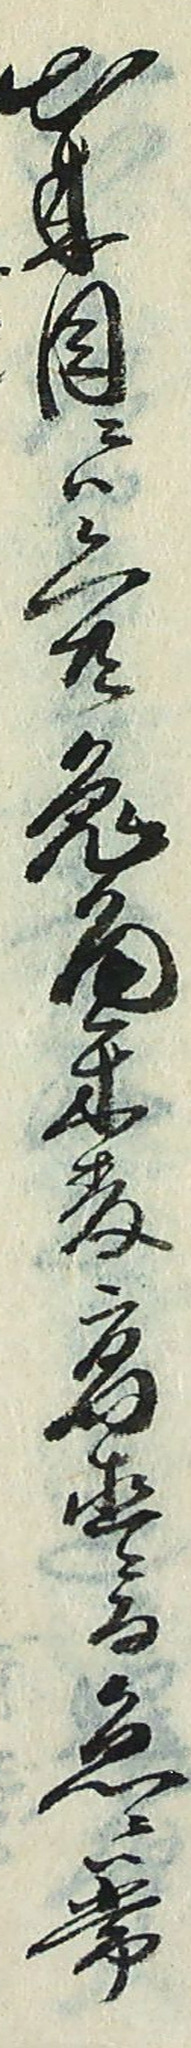出来目ニハ候へ共兎角米麦高直ニ而急ニハ常
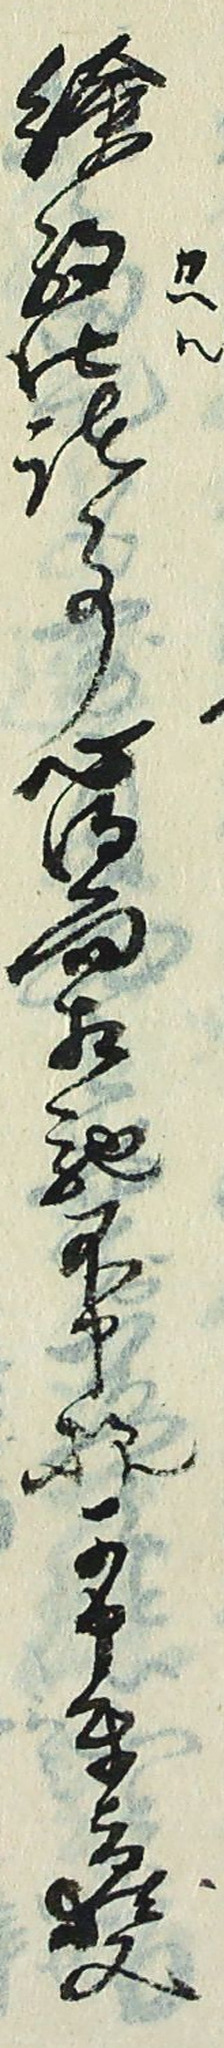倹約仕諸事心得向相弛不申様可申付旨猶又
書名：諸御趣意書并御下知向之写
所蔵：鳴門教育大学 Naruto University of Education
